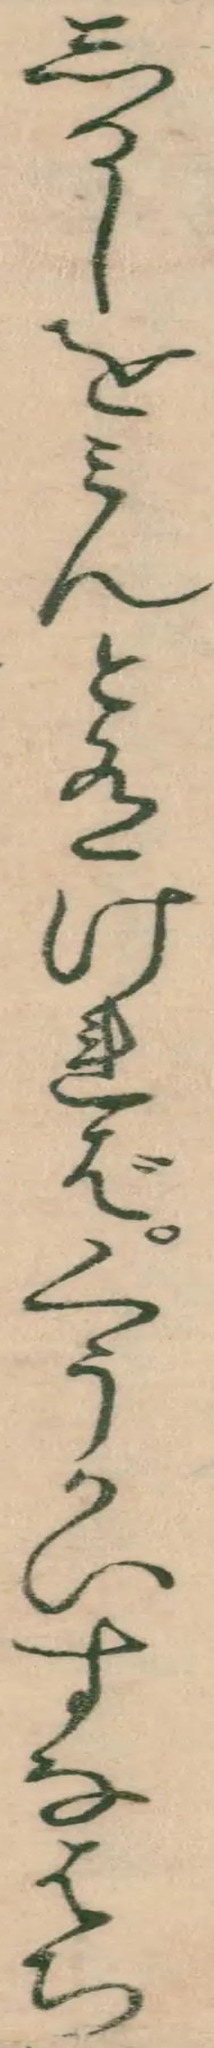しるしをみんと有ければ。くうかいはすなはち
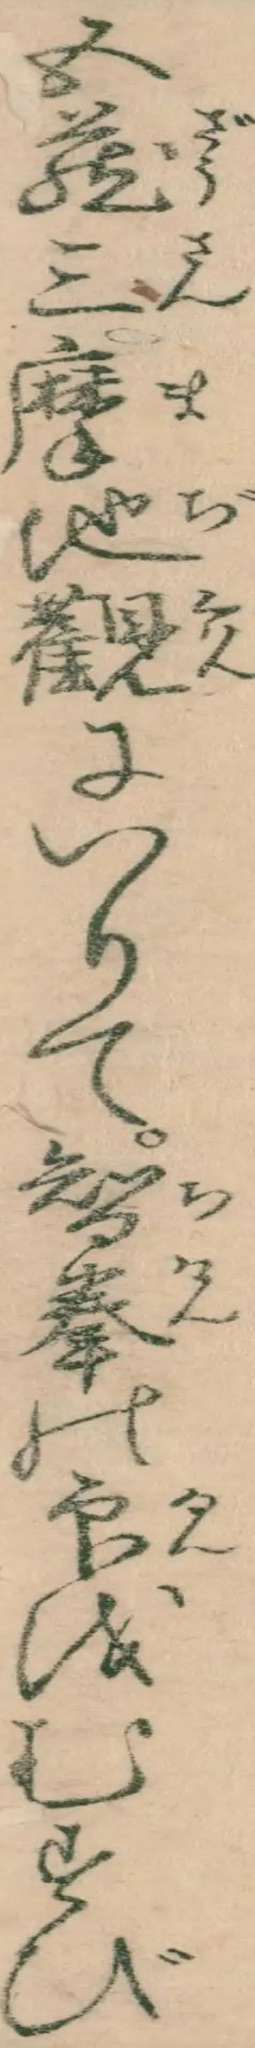五蔵三摩地観にいりて。智拳の印をむすび
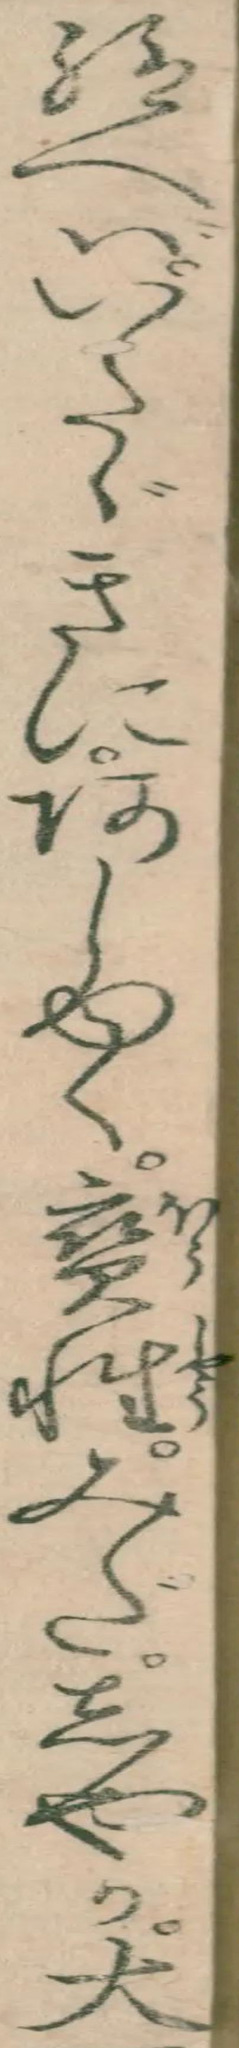給へば。いたゞきに。あしゆく。宝性。みだ。しやか。大
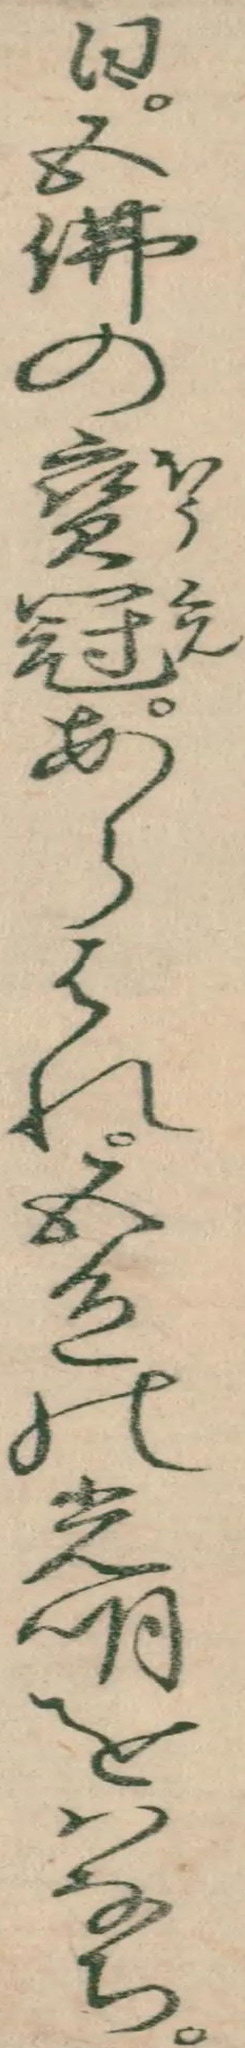日。五仏の宝冠。あらはれ。五色の光明をはなち。
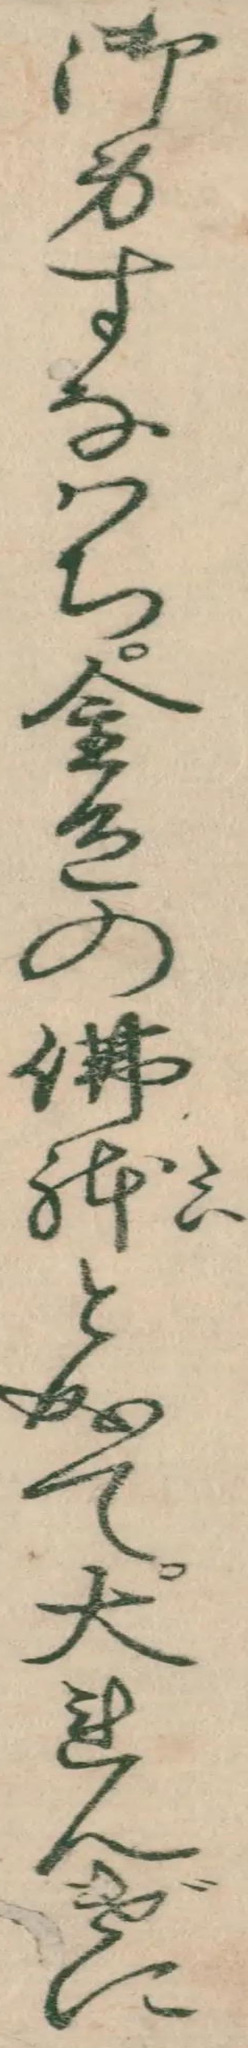御身すなはち。金色の仏体と成て。大れんげに
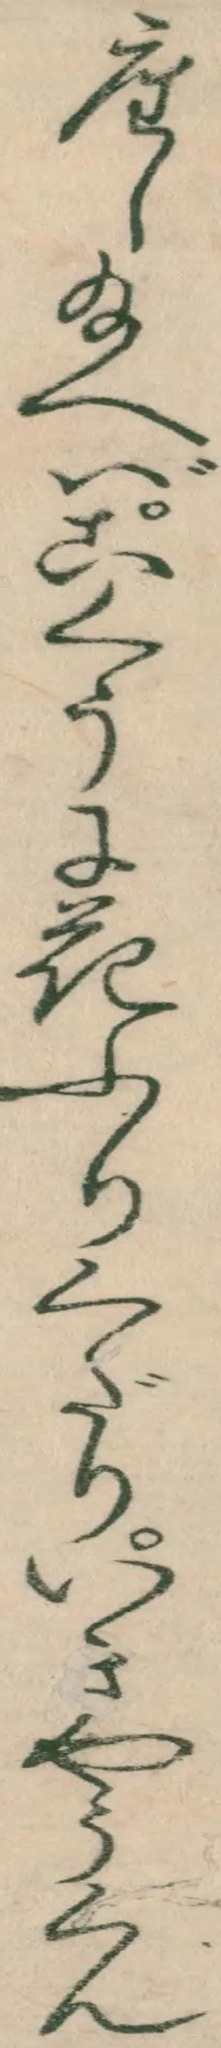座し給へば。こくうに花ふりくだり。いきやうくん
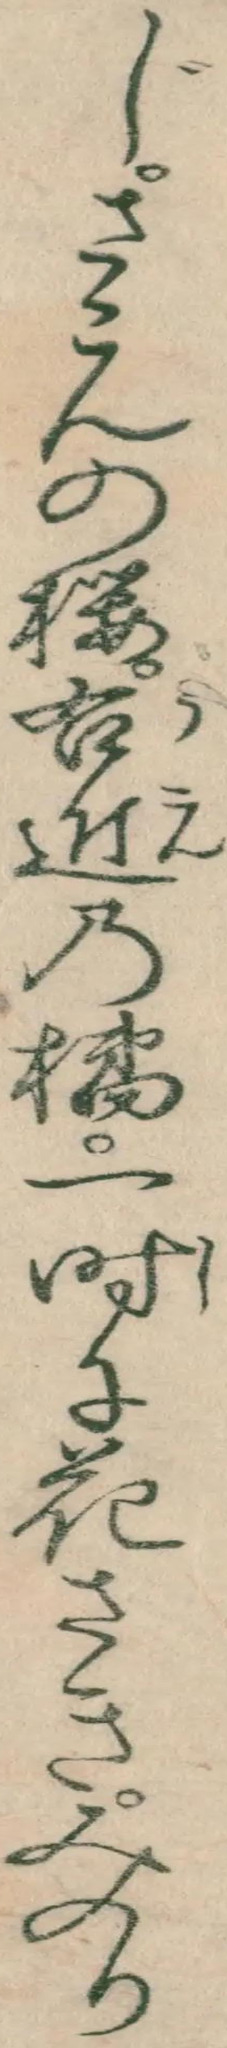じ。さこんの桜。右近の橘。一時に花さき。みのり
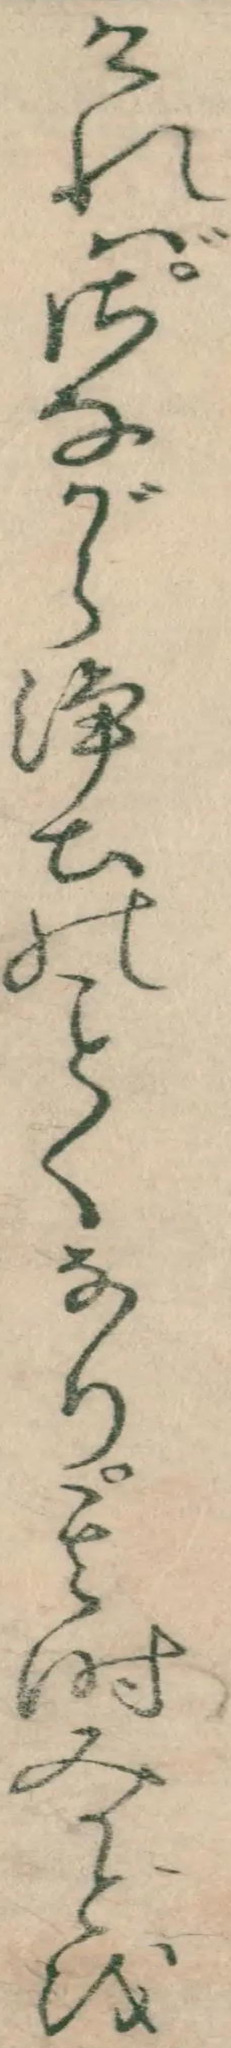ければ。さながら浄土のことくなり。其時みかどを
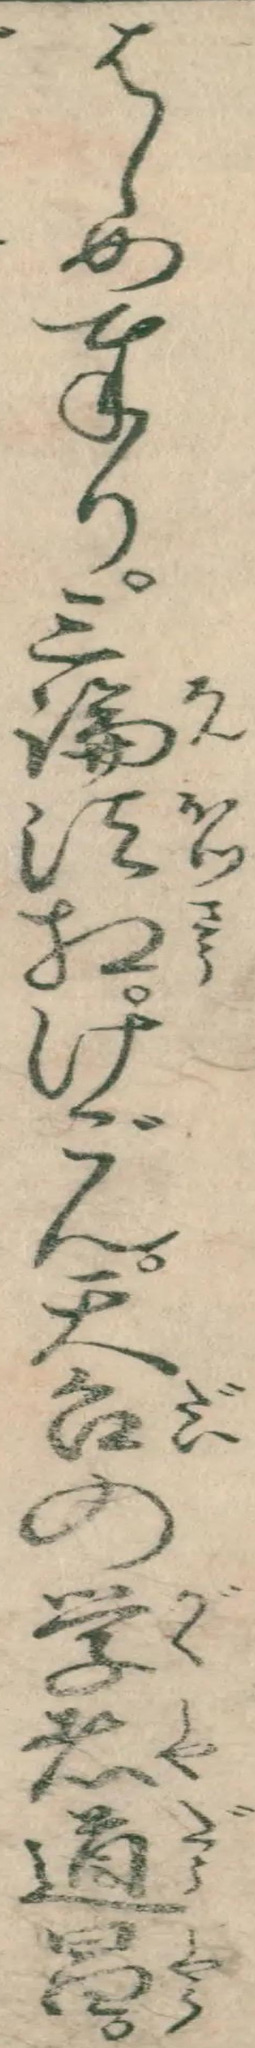はしめ奉り。三論法相。けごん。天台の学者道昌。
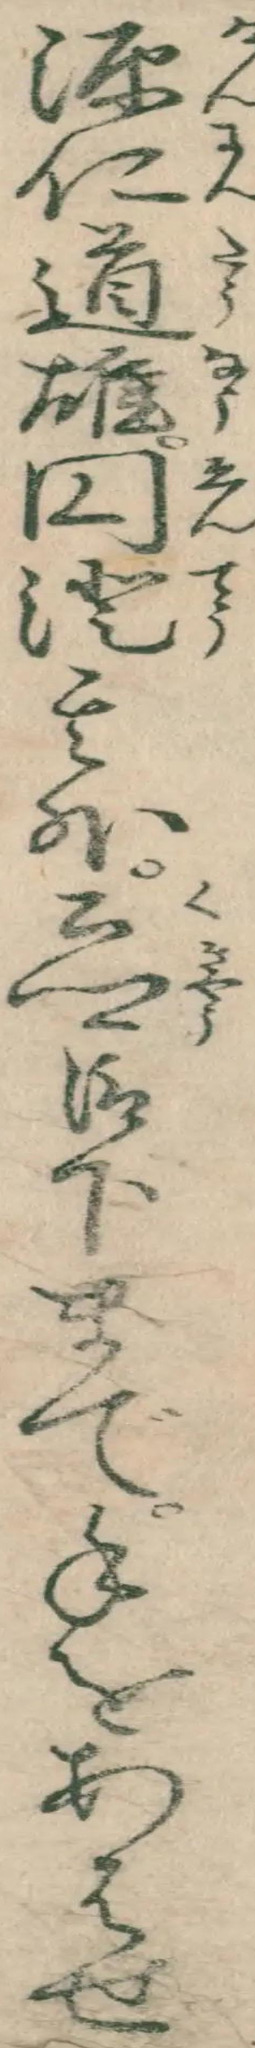源仁道雄円澄其外。公卿臣下まで。手をあはせ
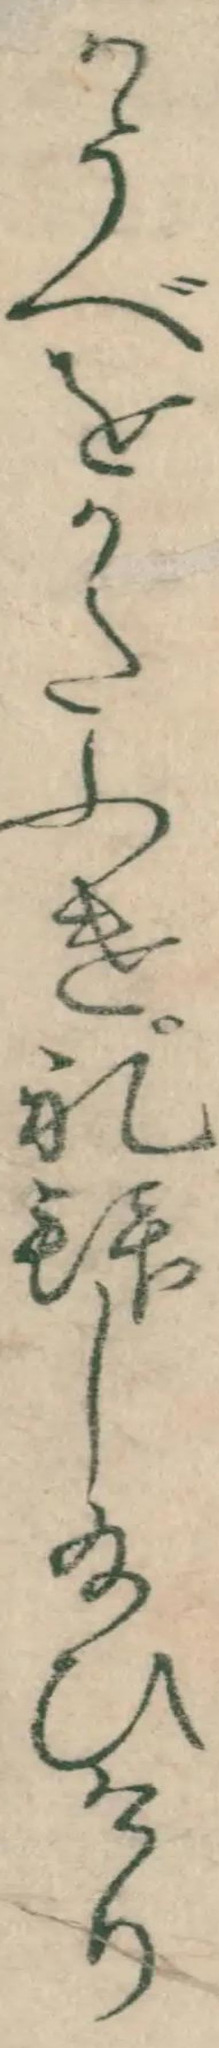かうべをかたふき。礼拝し給ひけり

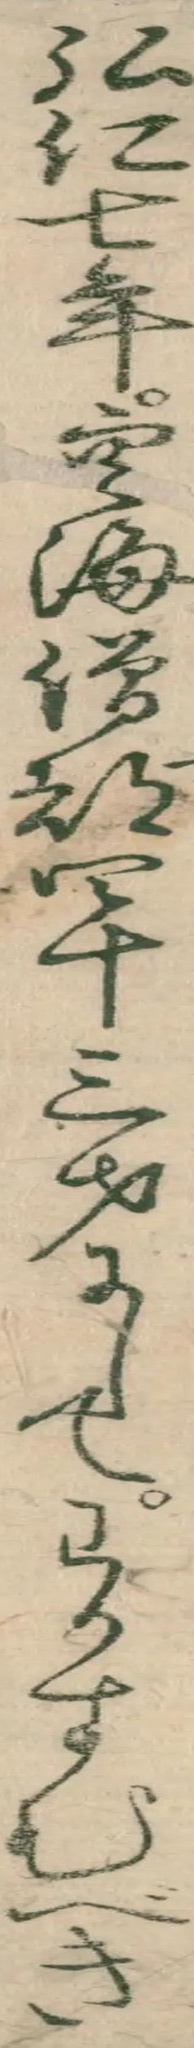弘仁七年。空海僧都四十三才にして。わかすむべき
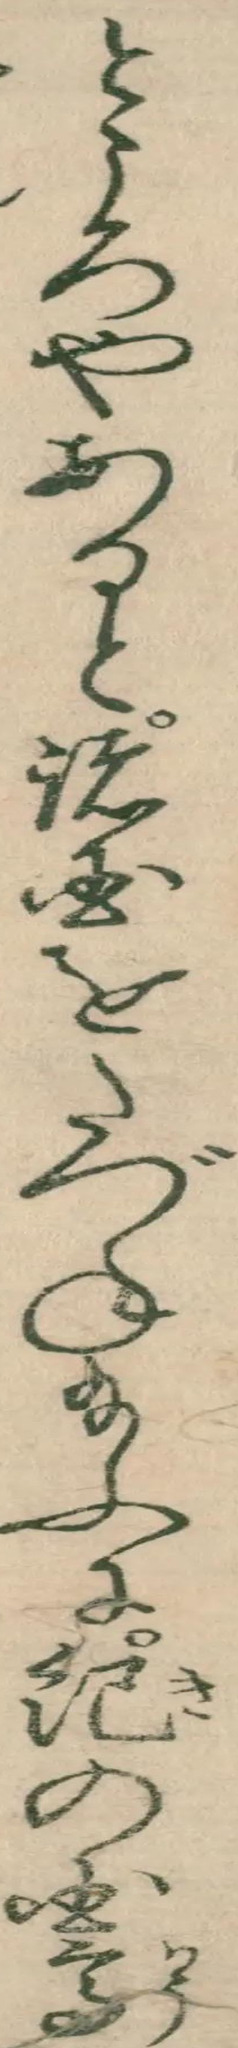ところやあると。諸国をたづね給ふに。紀の国高
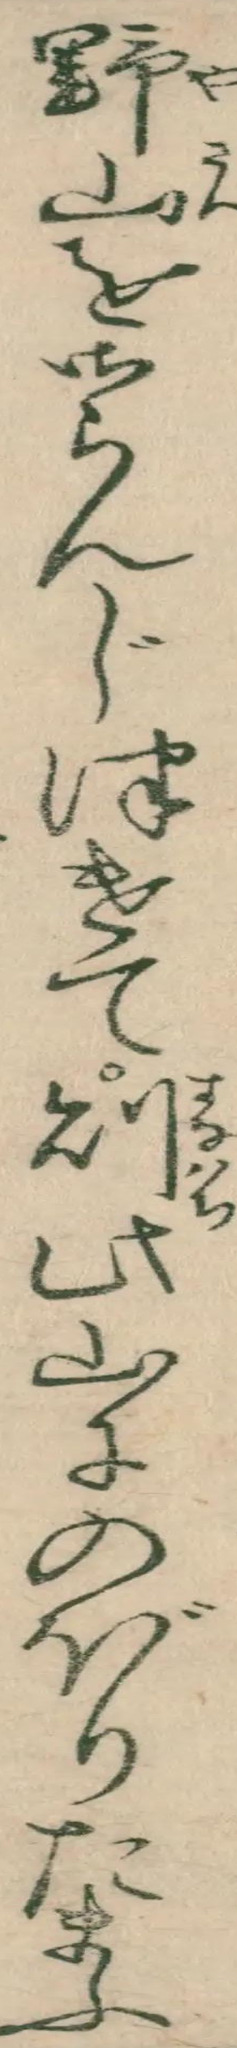野山を御らんじつけて。則此山にのぼりたまふ
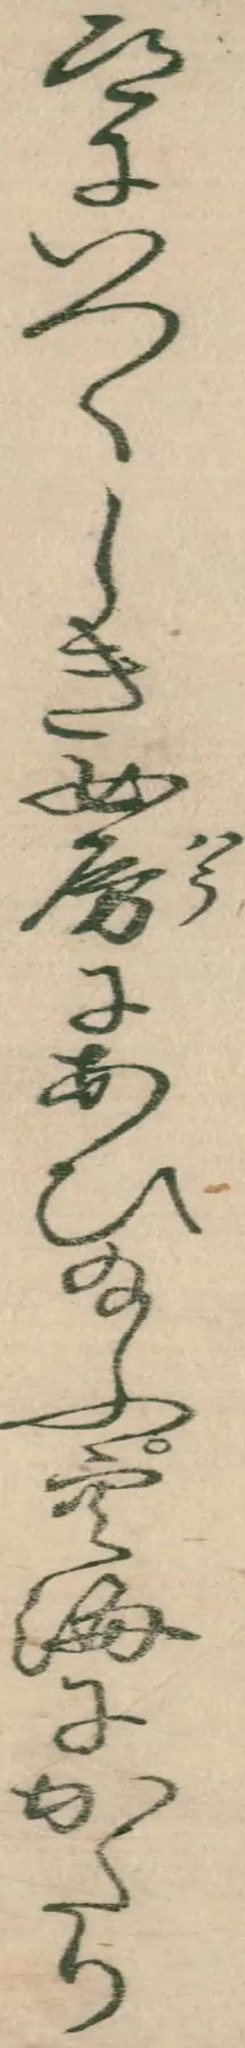道にいつくしき女房にあひ給ふ。空海にかたり
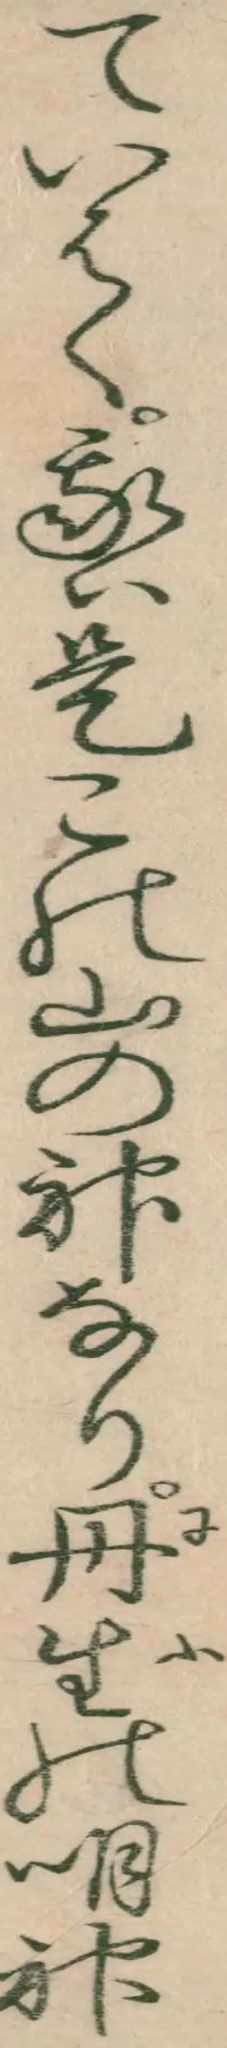ていはく。我は是この山の神なり。丹生の明神
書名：弘法大師御本地 3巻. [2]
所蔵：国立国会図書館 National Diet Library, JAPAN
